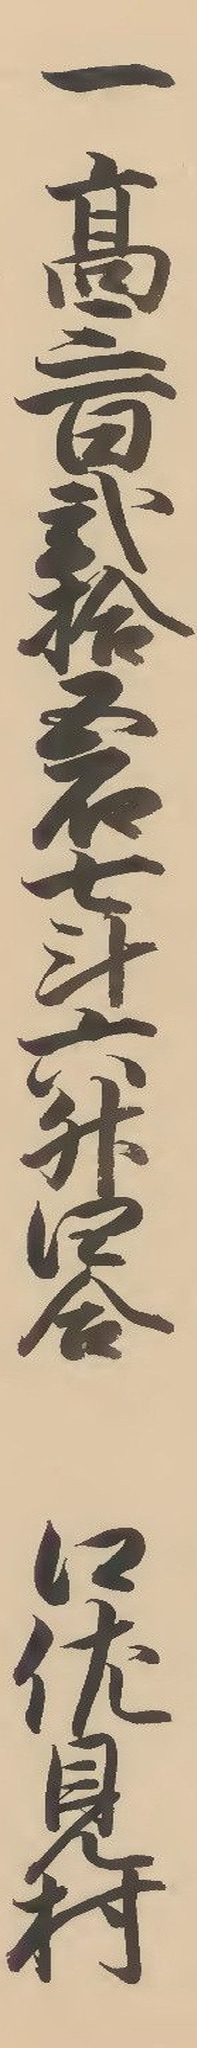一髙三百弐拾五石七斗六升四合口佐見村

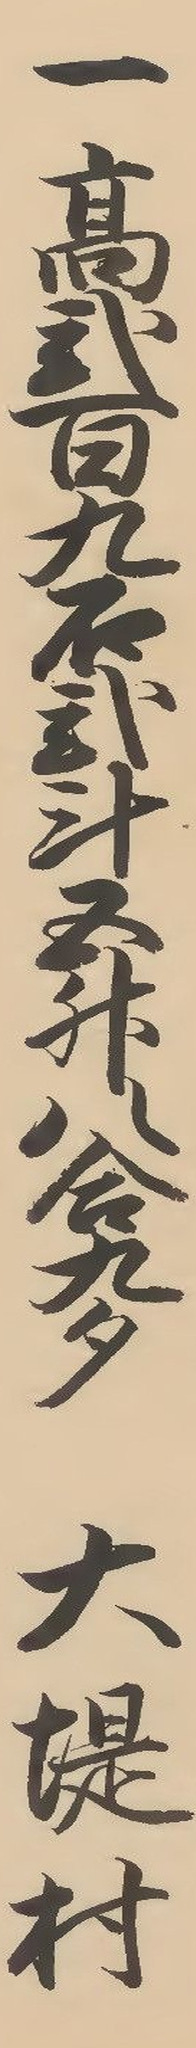一髙弐百九石弐斗五升八合九夕大堤村
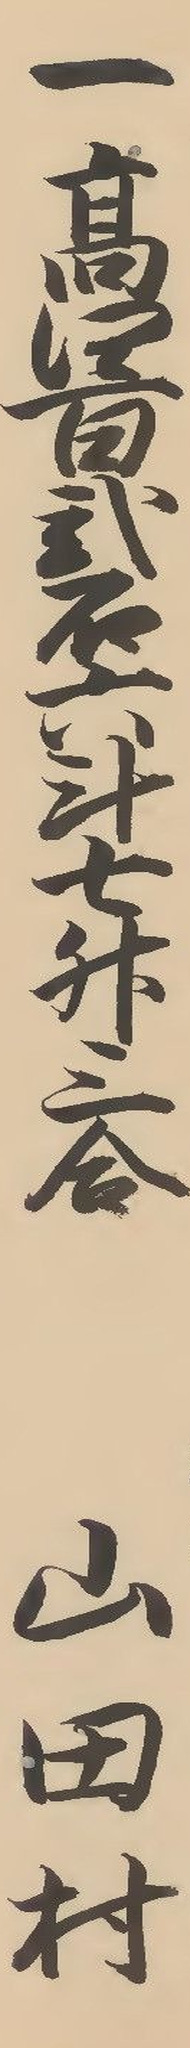一髙四百弐石六斗七升三合山田村
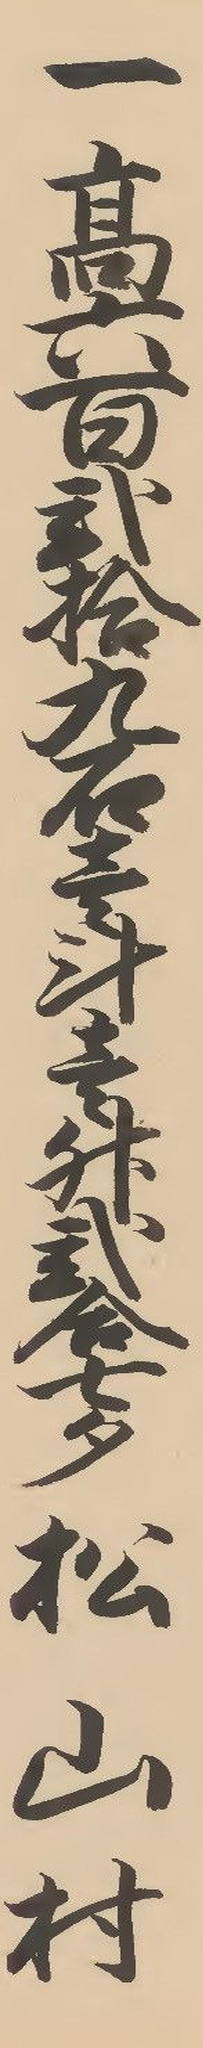一髙六百弐拾九石壱斗壱升弐合七夕松山村
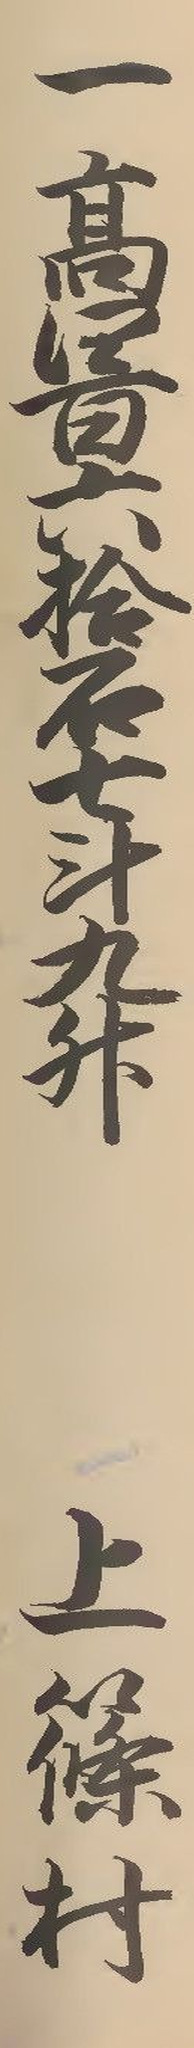一髙四百六拾石七斗九升上篠村
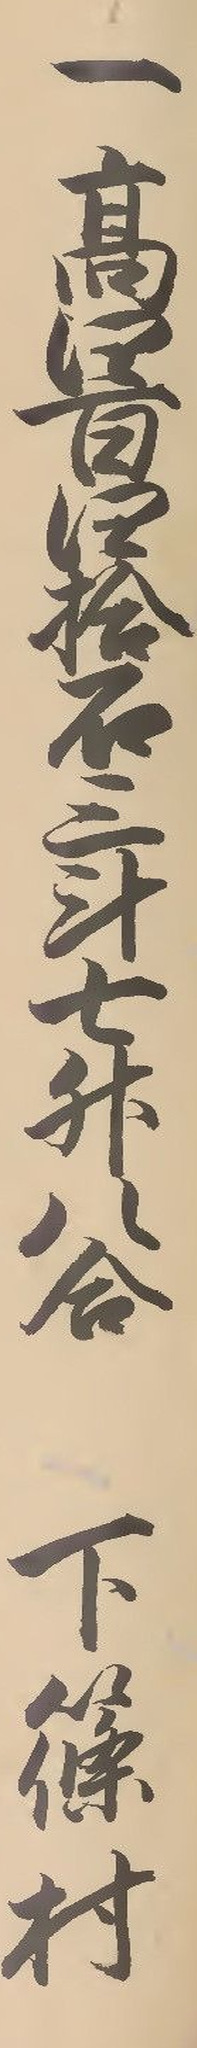一髙四百四拾石三斗七升八合下篠村
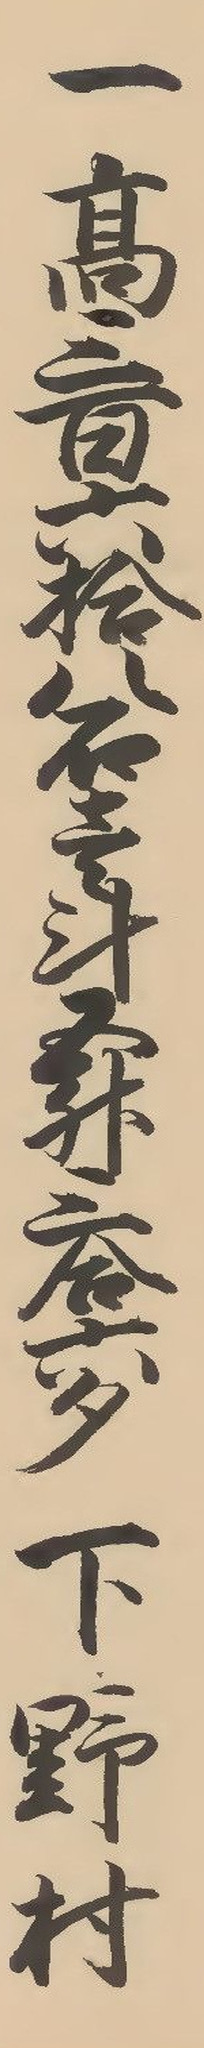一髙三百六拾八石壱斗五升三合六夕下野村
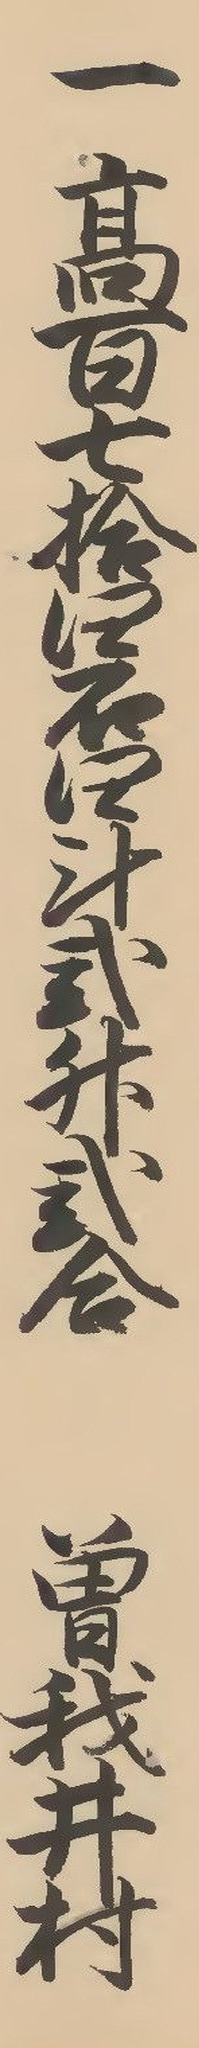一髙百七拾四石四斗弐升弐合曽我井村
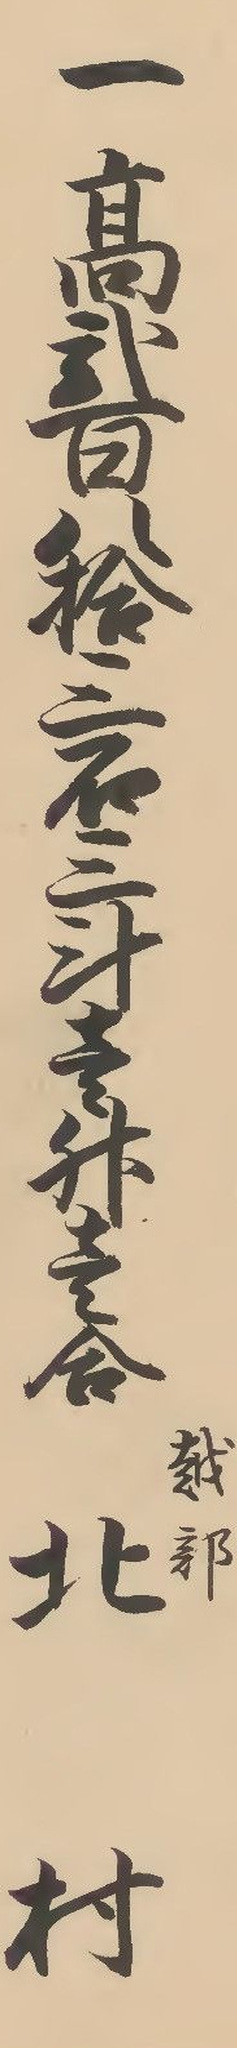一髙弐百八拾三石三斗壱升壱合北村

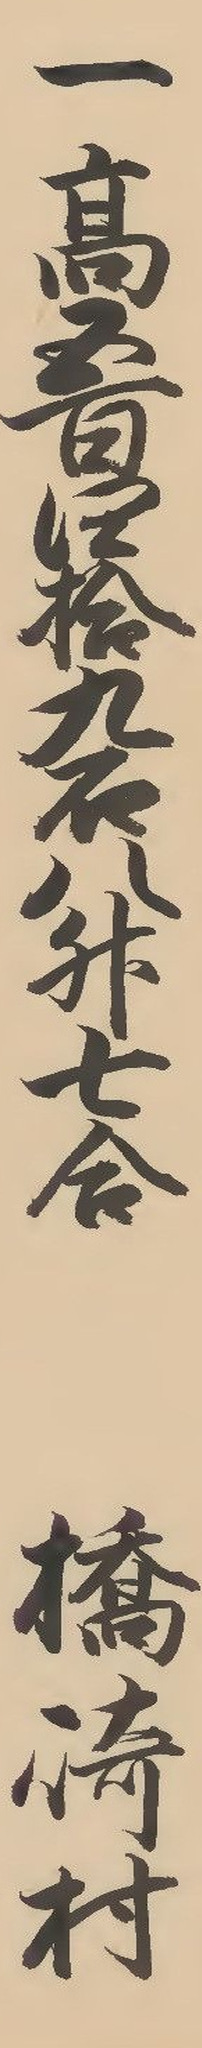一髙五百四拾九石八升七合橋崎村
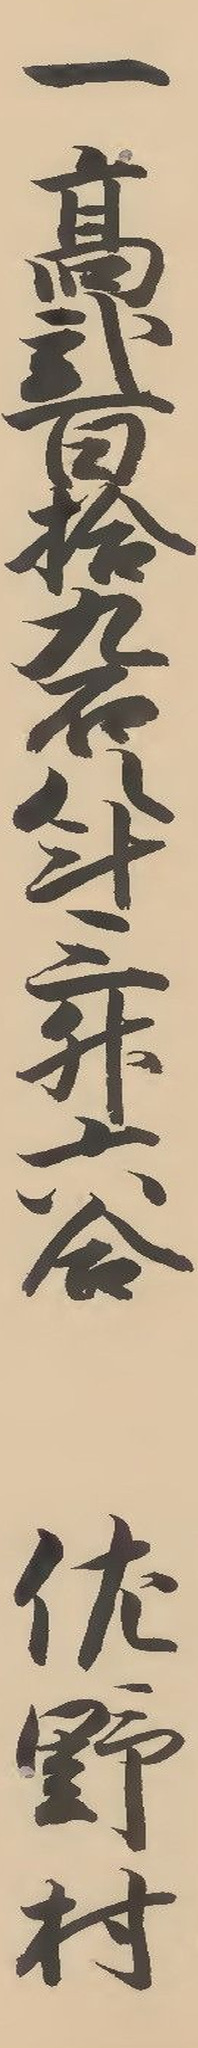一髙弐百拾九石八斗三升六合佐野村
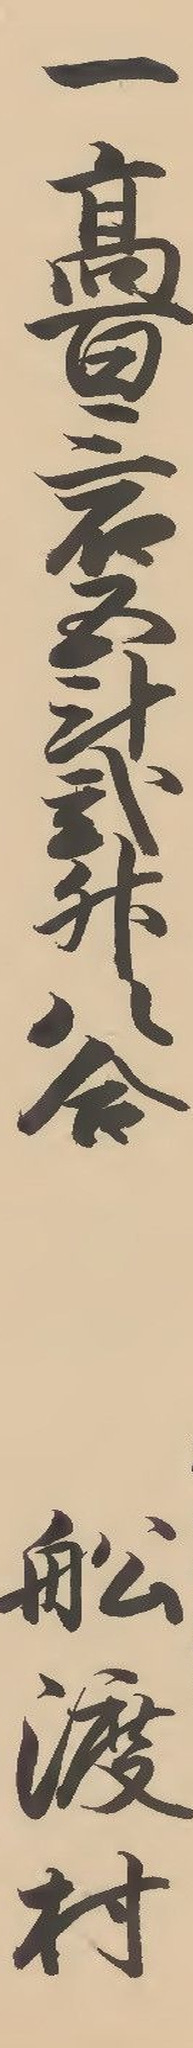一髙百三石五斗弐升八合舩渡村
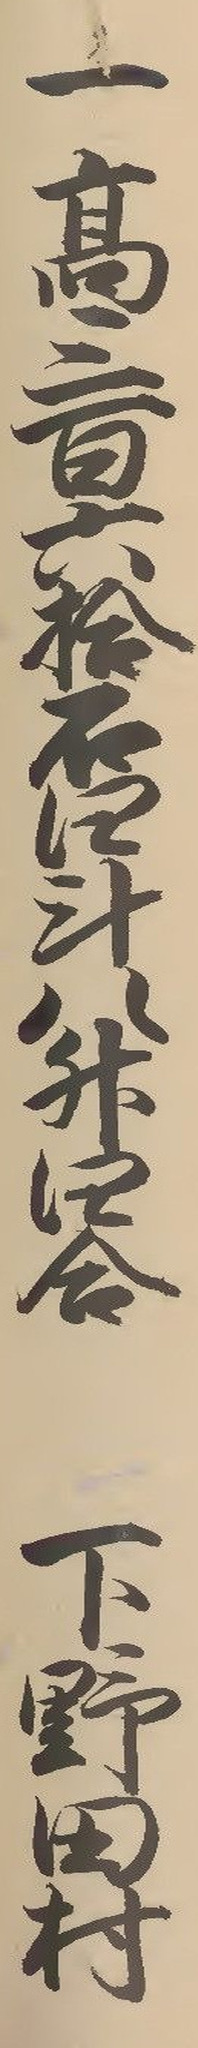一髙三百六拾石四斗八升四合下野田村
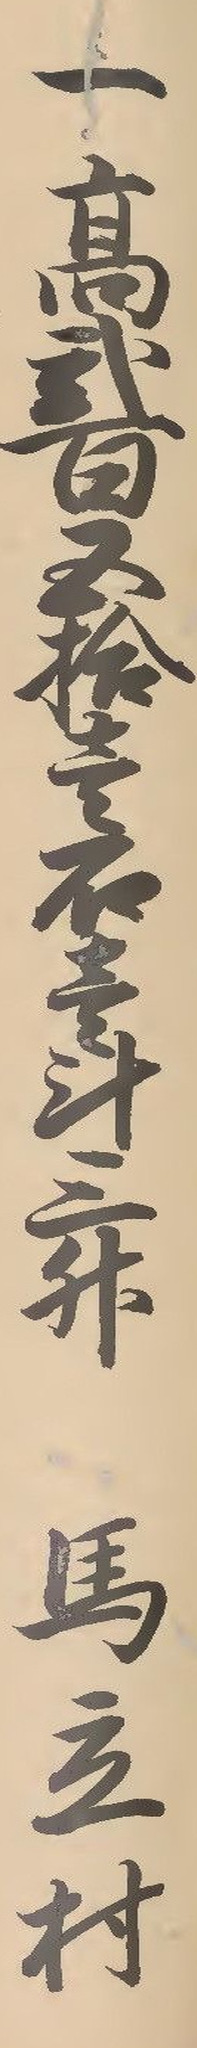一髙弐百五拾壱石壱斗三升馬立村
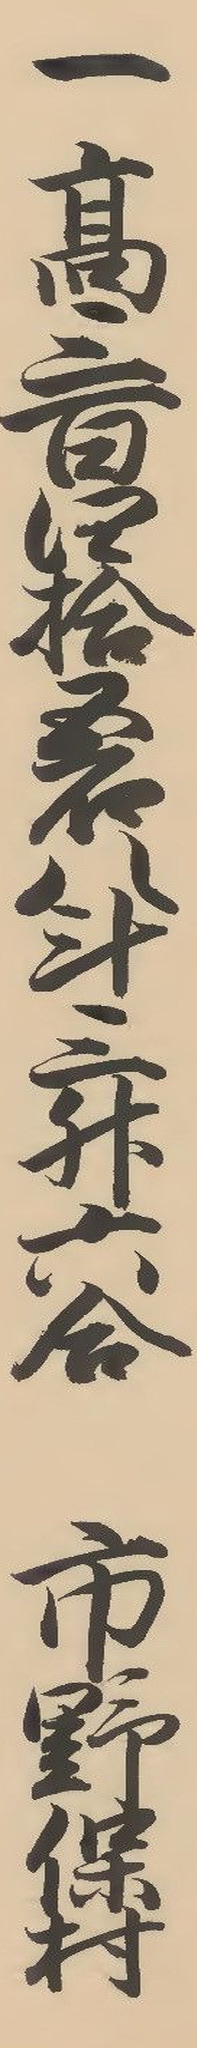一髙三百四拾五石八斗三升六合市野保村
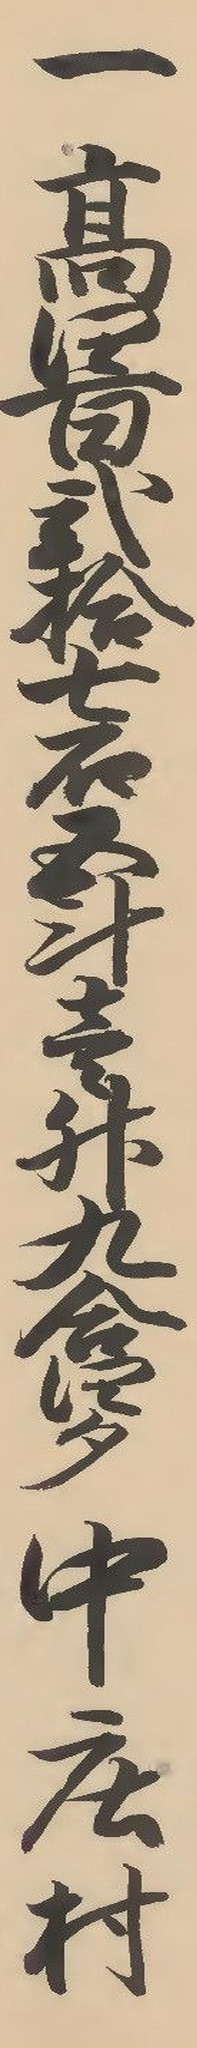一髙四百弐拾七石五斗壱升九合四夕中庄村
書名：播磨国郷帳
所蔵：国立公文書館 National Archives of Japan
